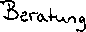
Beratung
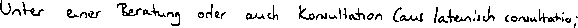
Unter einer Beratung oder auch Konsultation (aus lateinisch consultatio;
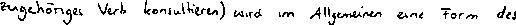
zugehöriges Verb konsultieren) wird im Allgemeinen eine Form des
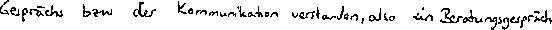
Gesprächs bzw. der Kommunikation verstanden, also ein Beratungsgespräch
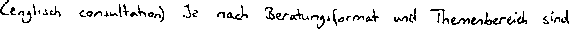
(englisch consultation). Je nach Beratungsformat und Themenbereich sind
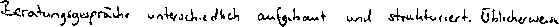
Beratungsgespräche unterschiedlich aufgebaut und strukturiert. Üblicherweise
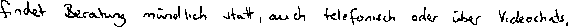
findet Beratung mündlich statt, auch telefonisch oder über Videochats,
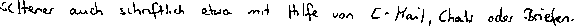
seltener auch schriftlich etwa mit Hilfe von E-Mail, Chats oder Briefen.
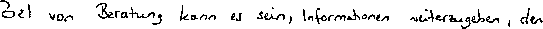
Ziel von Beratung kann es sein, Informationen weiterzugeben, den
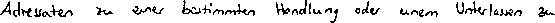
Adressaten zu einer bestimmten Handlung oder einem Unterlassen zu
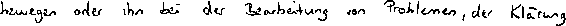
bewegen oder ihn bei der Bearbeitung von Problemen, der Klärung
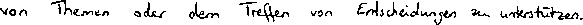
von Themen oder dem Treffen von Entscheidungen zu unterstützen.
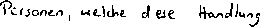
Personen, welche diese Handlung
